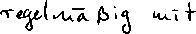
regelmäßig mit
